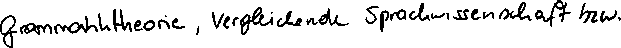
Grammatiktheorie, Vergleichende Sprachwissenschaft bzw.
